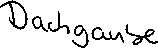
Dachgaube
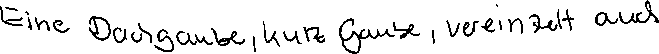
Eine Dachgaube, kurz Gaube, vereinzelt auch
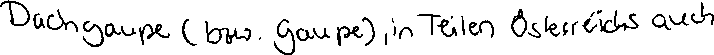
Dachgaupe (bzw. Gaupe), in Teilen Österreichs auch
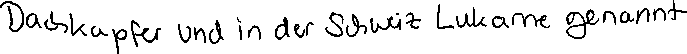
Dachkapfer und in der Schweiz Lukarne genannt
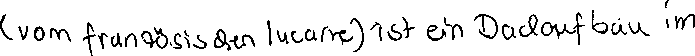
(vom französischen lucarne), ist ein Dachaufbau im
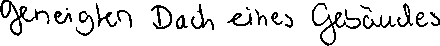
geneigten Dach eines Gebäudes.
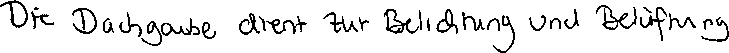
Die Dachgaube dient zur Belichtung und Belüftung
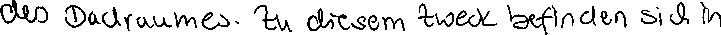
des Dachraumes. Zu diesem Zweck befinden sich in
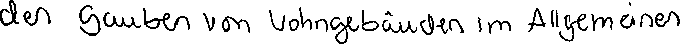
den Gauben von Wohngebäuden im Allgemeinen
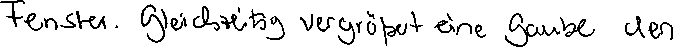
Fenster. Gleichzeitig vergrößert eine Gaube den
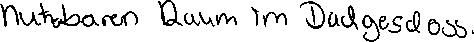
nutzbaren Raum im Dachgeschoss.
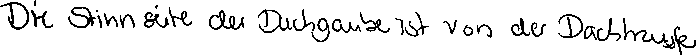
Die Stirnseite der Dachgaube ist von der Dachtraufe
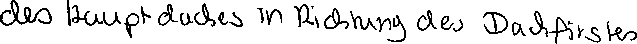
des Hauptdaches in Richtung des Dachfirstes
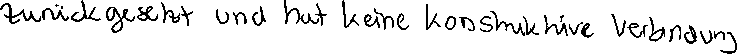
zurückgesetzt und hat keine konstruktive Verbindung
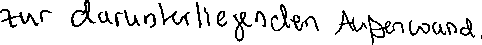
zur darunterliegenden Außenwand.
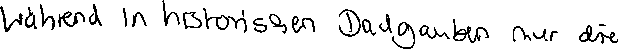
Während in historischen Dachgauben nur die
